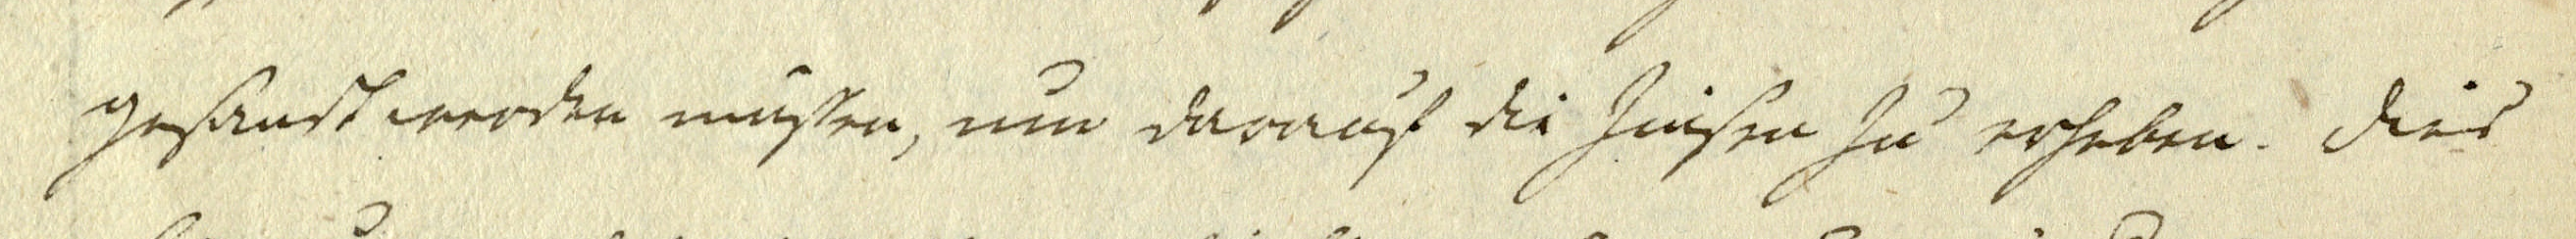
gesandt werden müssen, um darauf die Zinsen zu erheben. Dies
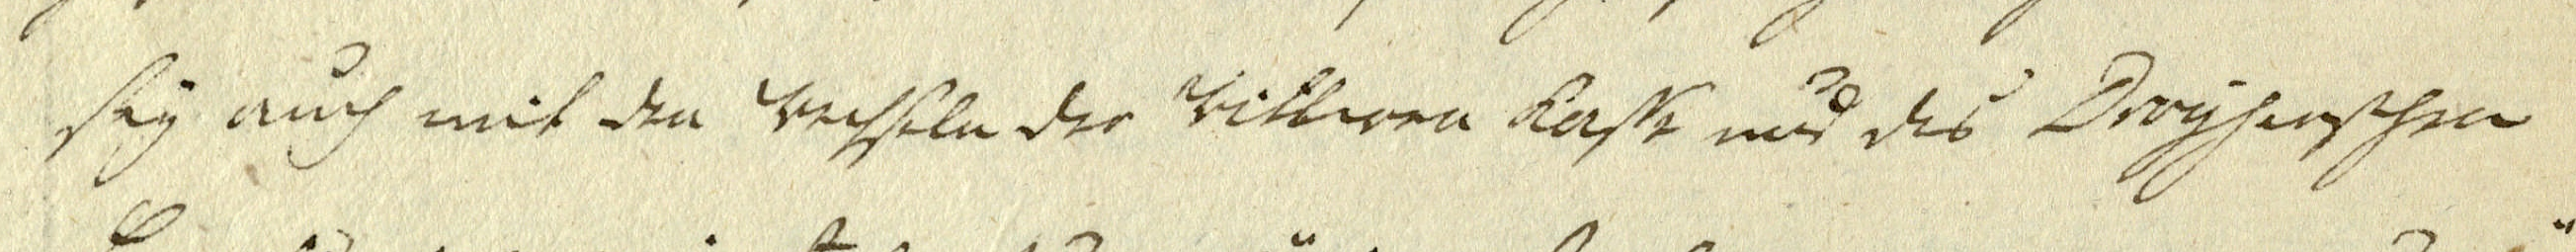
seÿ auch mit den Wechseln der Wittwen Casse und des Droÿsenschen
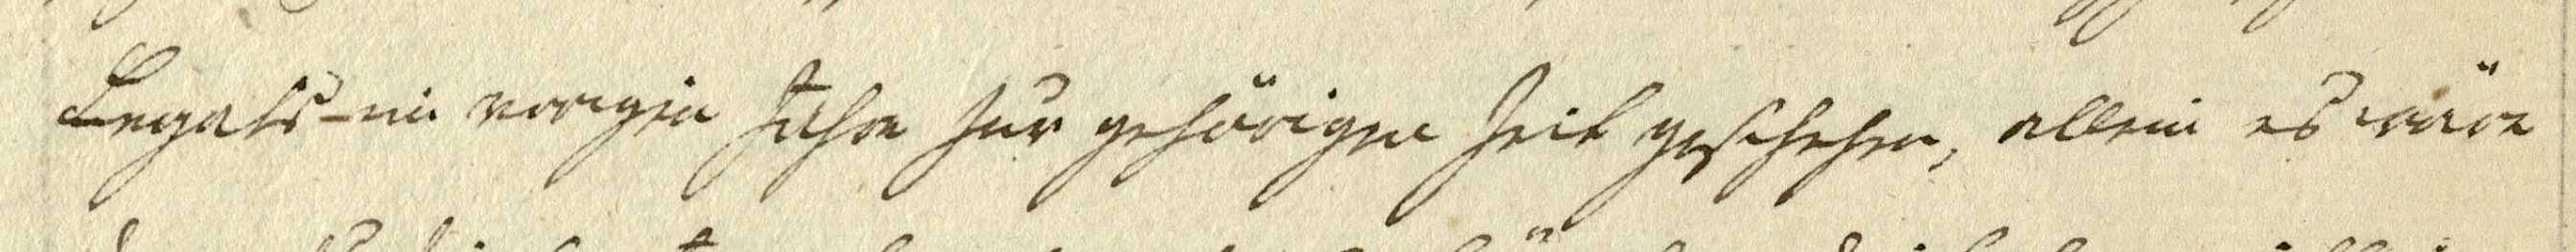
Legats im vorigen Jahre zur gehörigen Zeit geschehen, allein es wäre
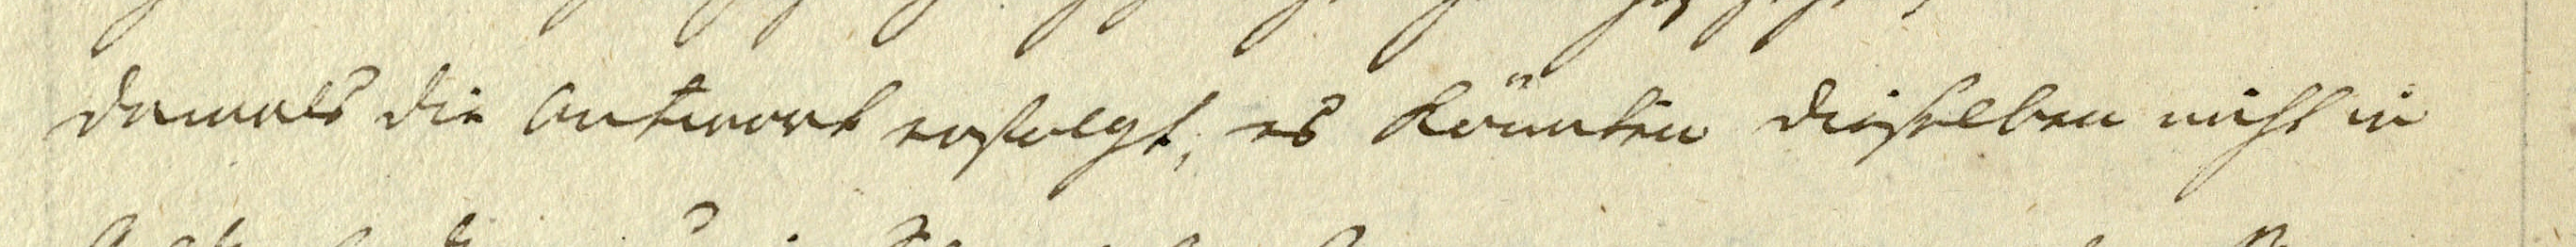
damals die Antwort erfolgt, es könnten dieselben nicht in
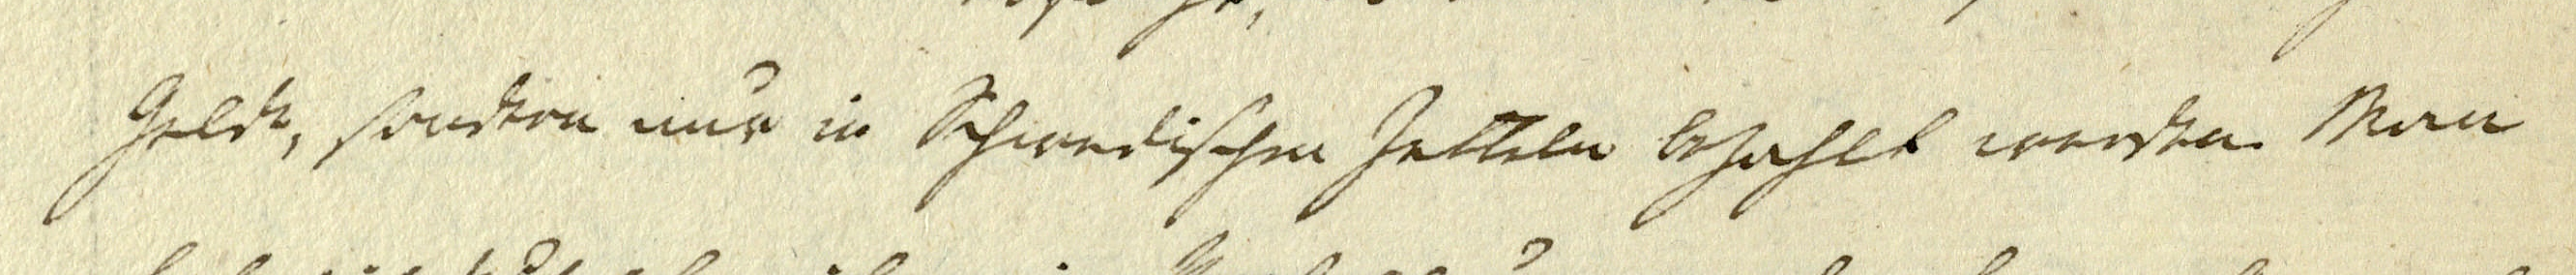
Gelde, sondern nur in Schwedischen Zetteln bezahlt werden. Man
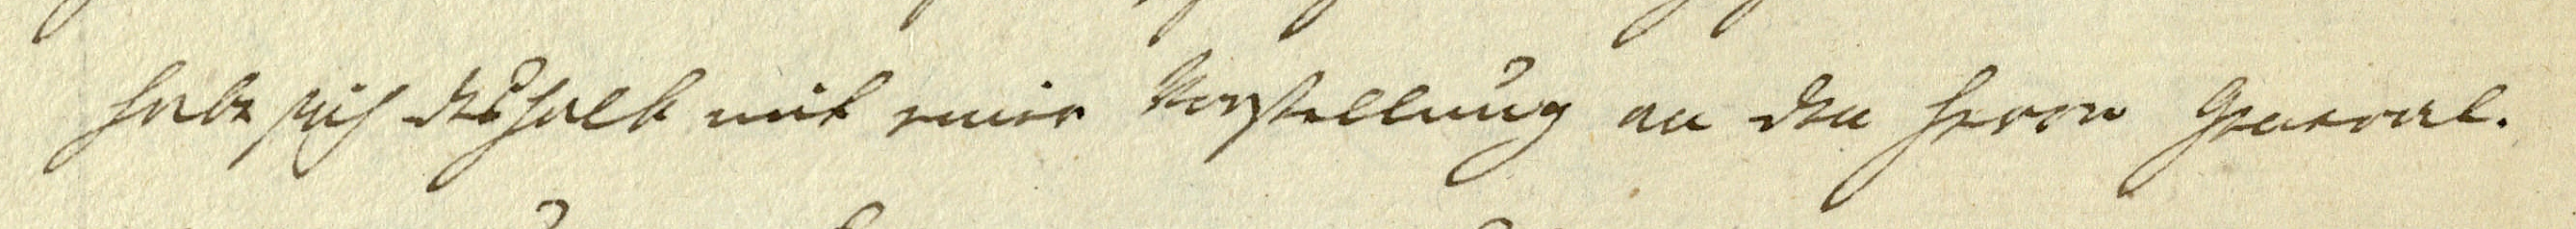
habe sich deshalb mit einer Vorstellung an den Herrn General
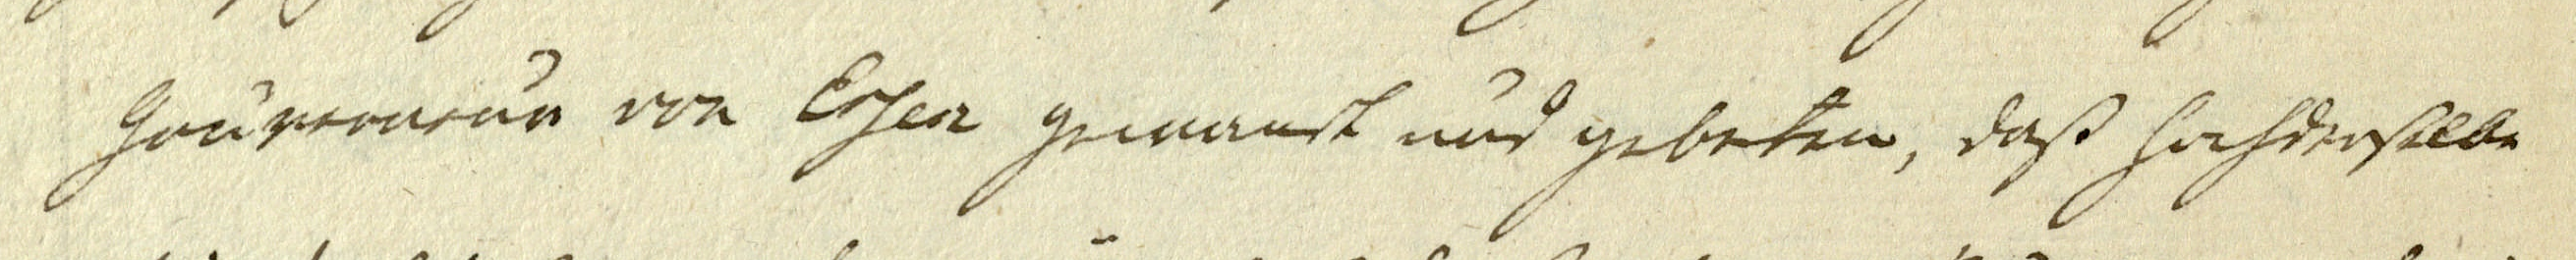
Gouverneur von Essen gewandt und gebeten, daß Hochderslbe
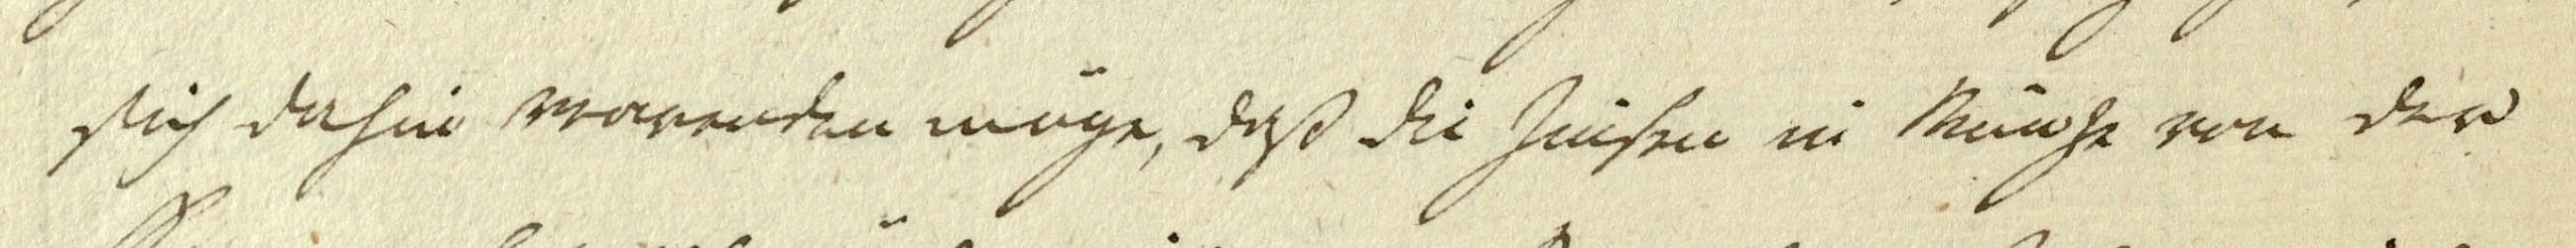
sich dahin verwenden möge, daß die Zinsen in Münze von der
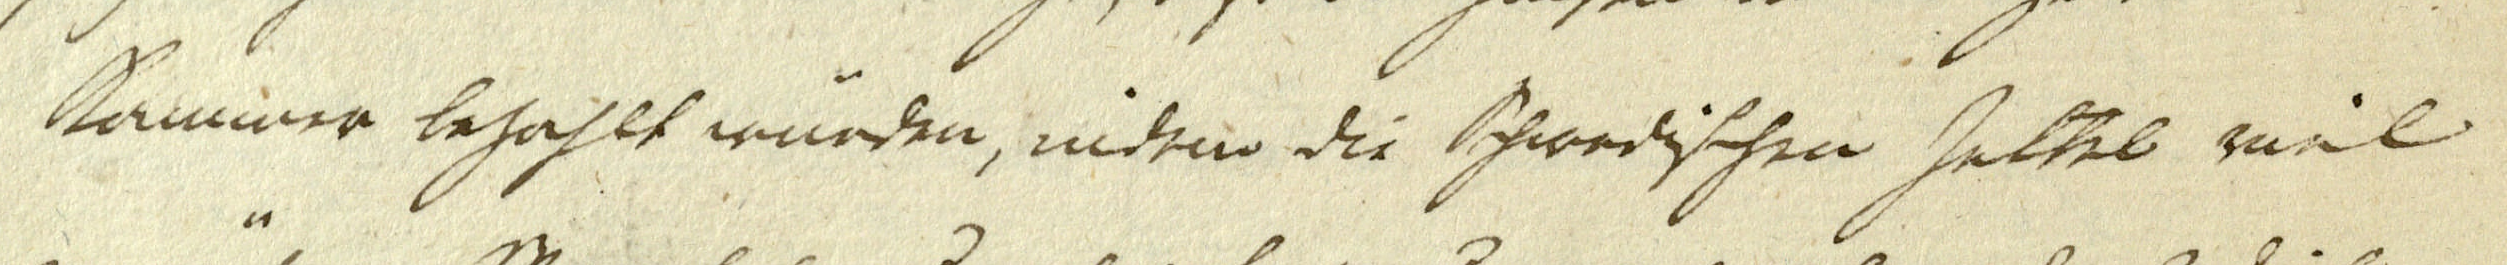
Kammer bezahlt würden, indem die Schwedischen Zettel viel
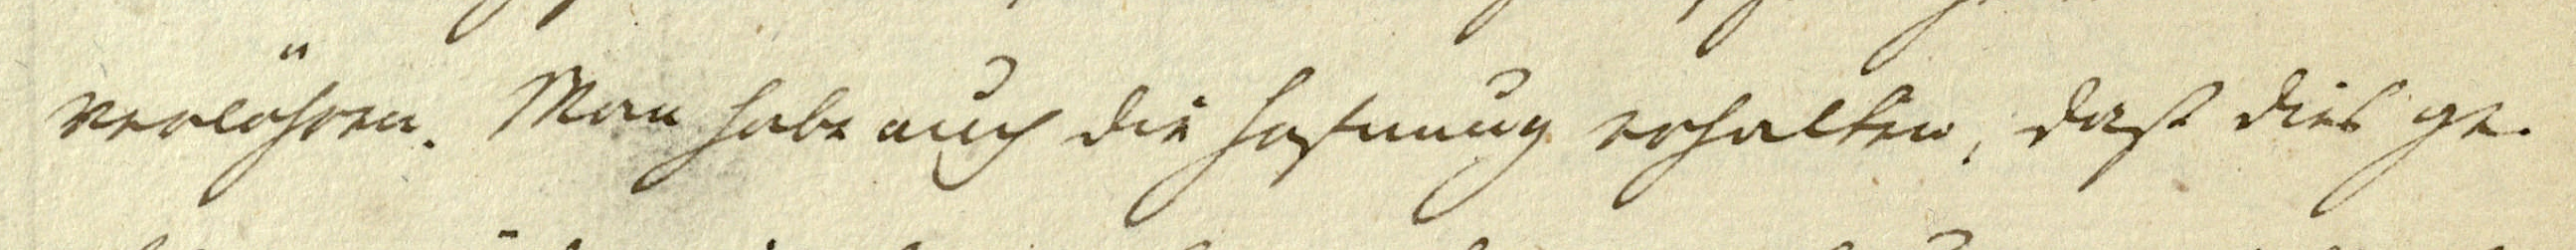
verlöhren. Man habe auch die Hofnung erhalten, daß dies ge¬
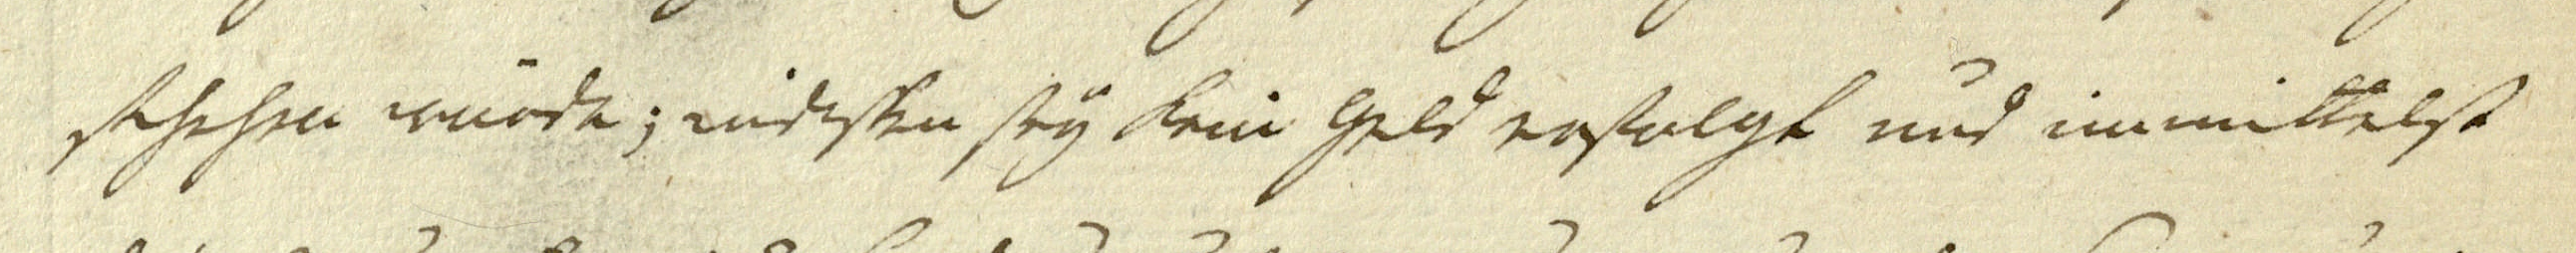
schehen würde; indessen seÿ kein Geld erfolgt und immittelst
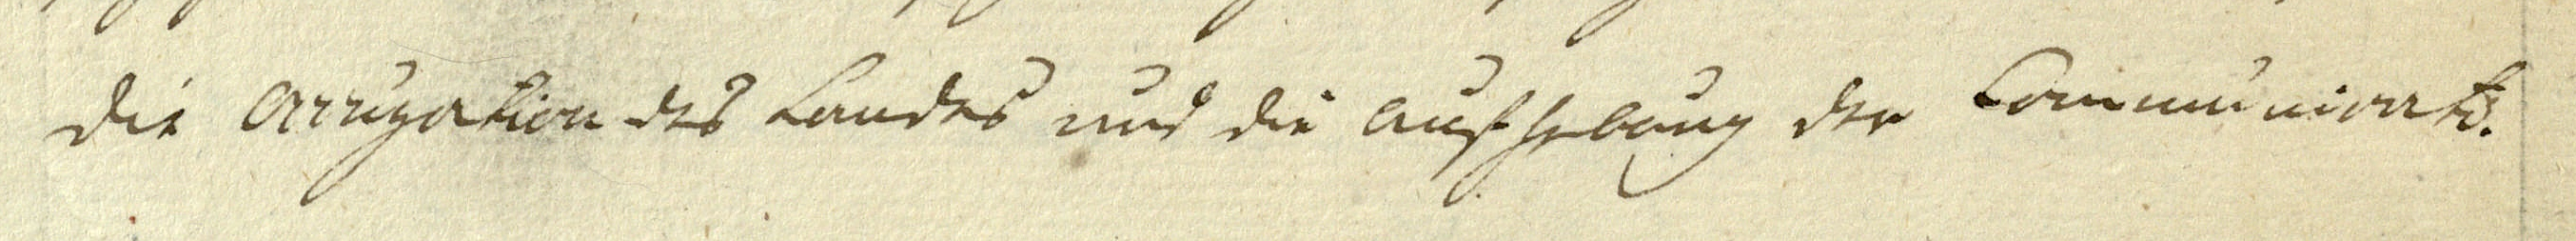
die Occupation des Landes und die Aufhebung der Communicati¬
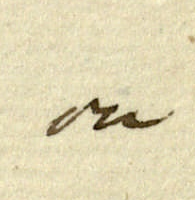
on
